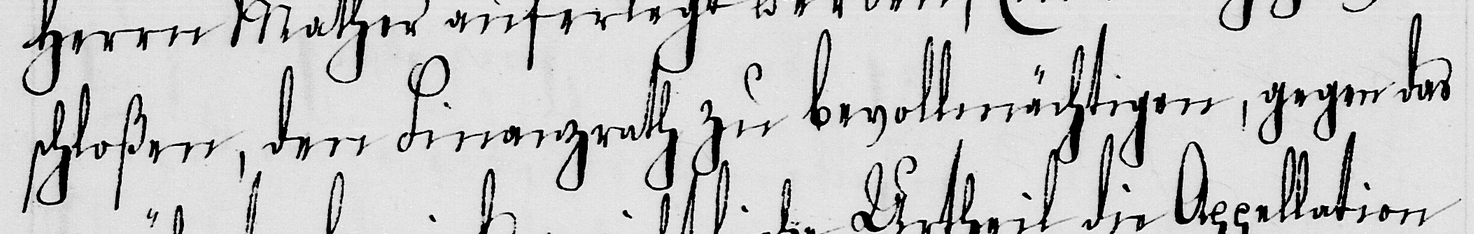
schloßen, den Finanzrath zu bevollmächtigen, gegen das
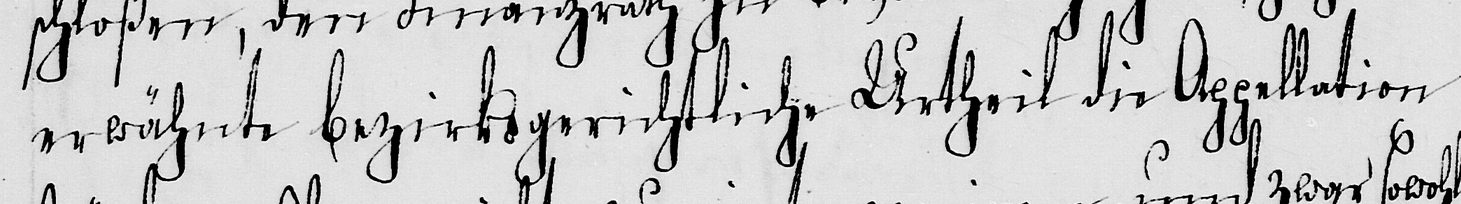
erwähnte bezirksgerichtliche Urtheil die Appellation
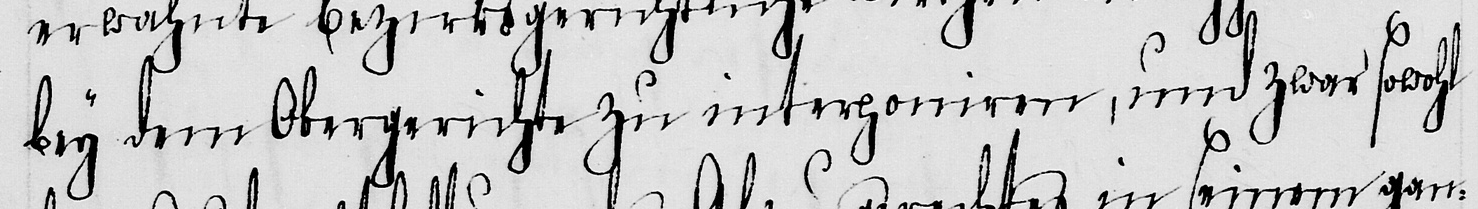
bey dem Obergerichte zu interponiren, und zwar sowohl
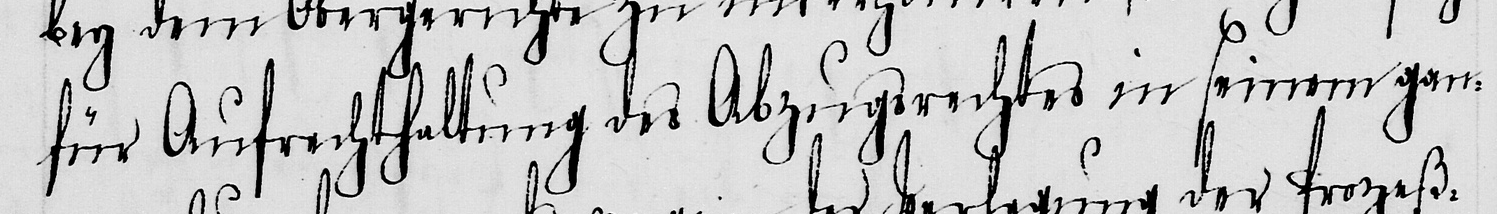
für Aufrechthaltung des Abzugsrechtes in seinem gan¬
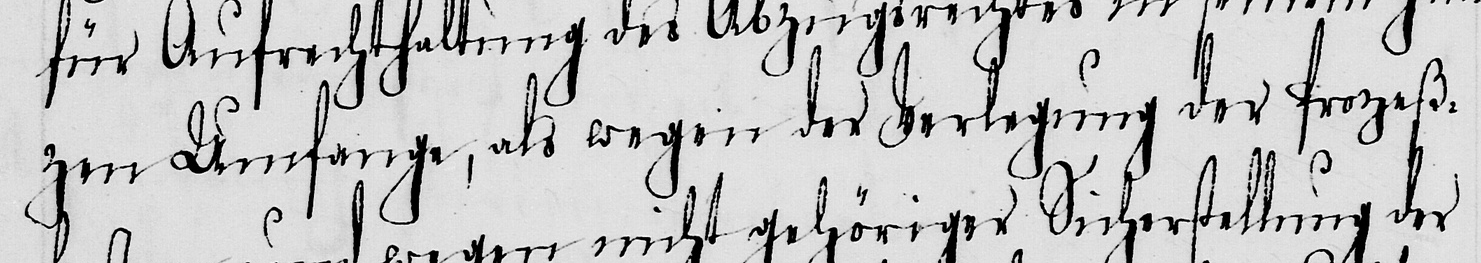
zen Umfange, als wegen der Verlegung der Prozeß¬
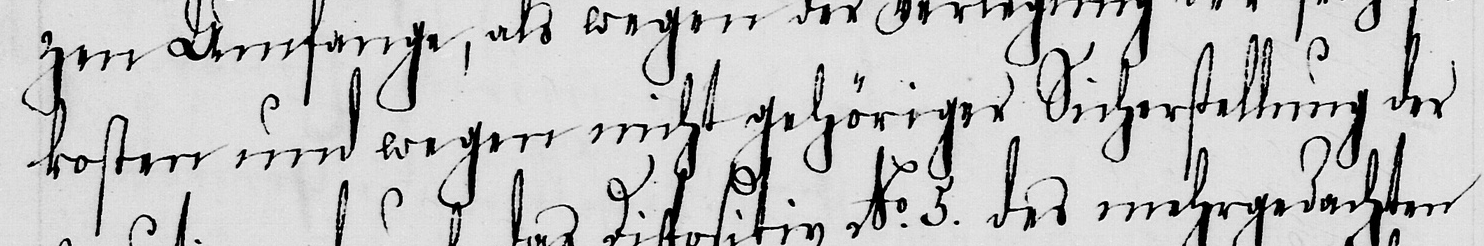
kosten und wegen nicht gehöriger Sicherstellung der
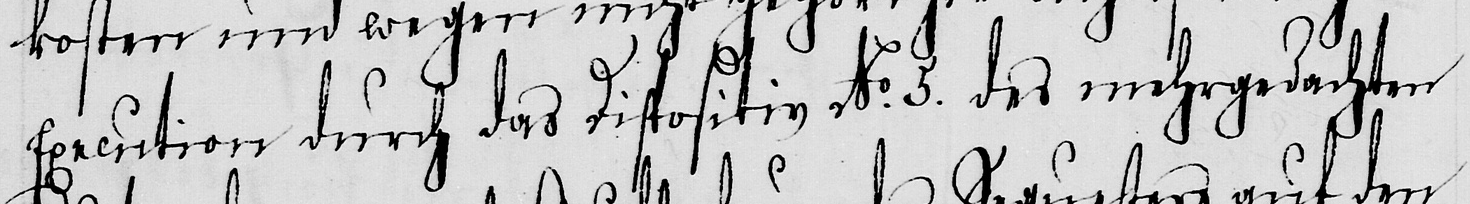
Execution durch das Dispositiv No. 5. des mehrgedachten
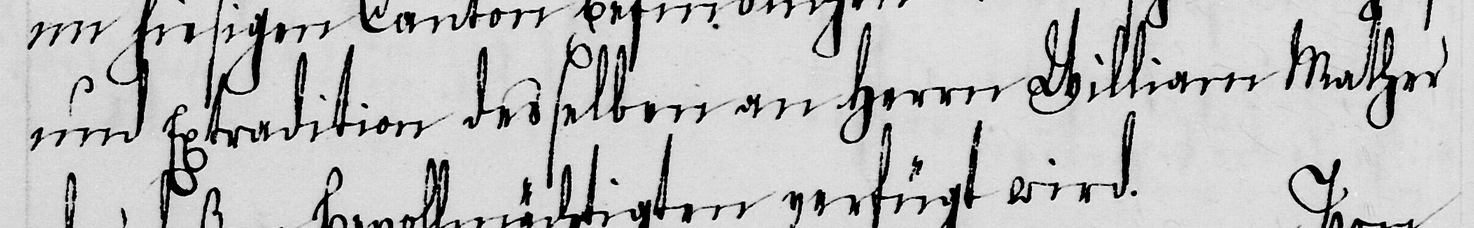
und Extradition desselben an Herrn William Mather
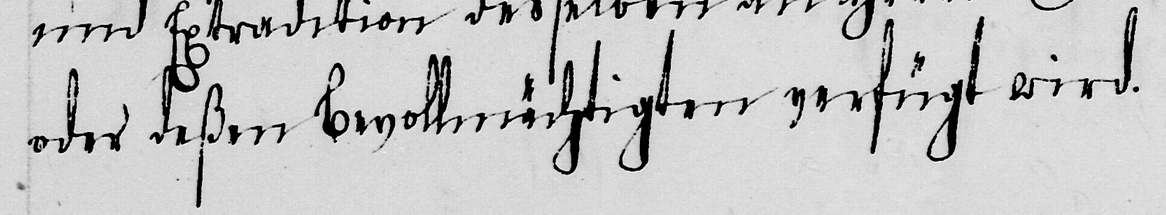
oder deßen Bevollmächtigten verfügt wird.
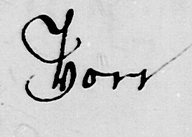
von
